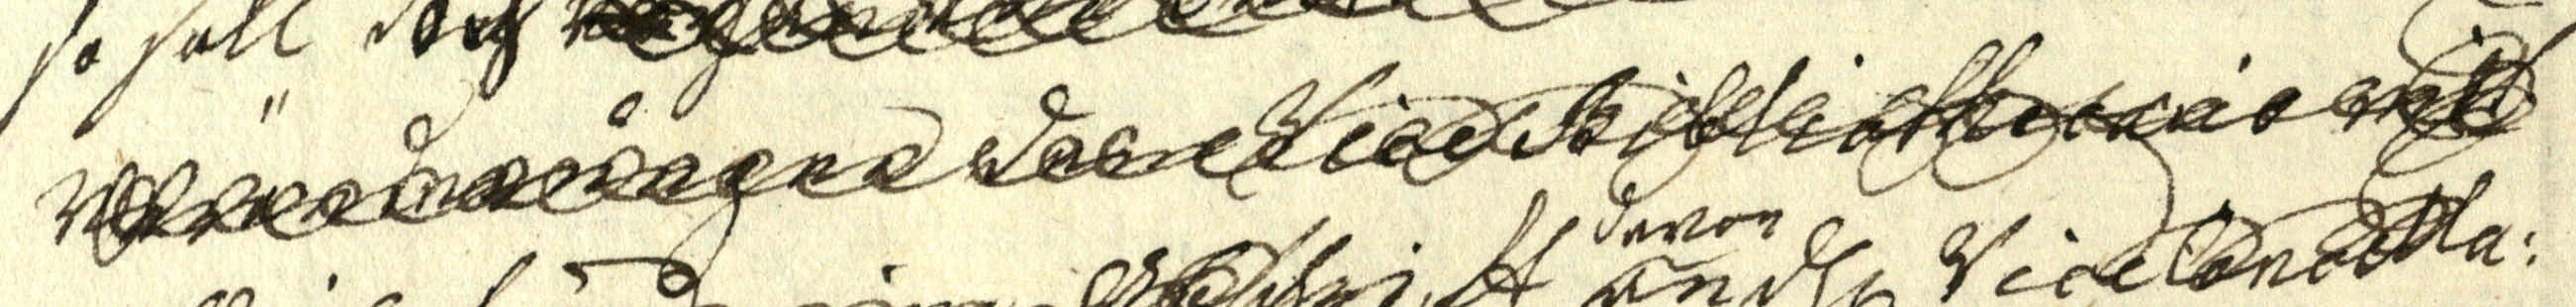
Veränderungen dem Vice Bibliothecario mit¬
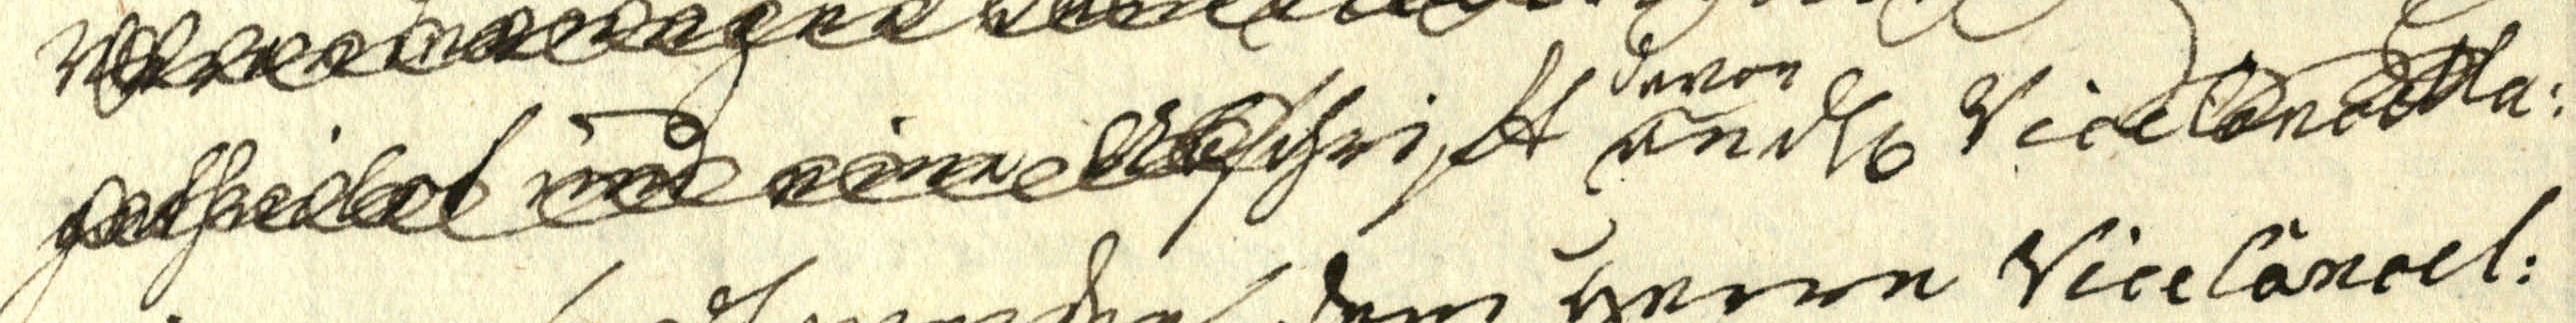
getheilet und eine Abschrift davon an den Vice Cancella¬
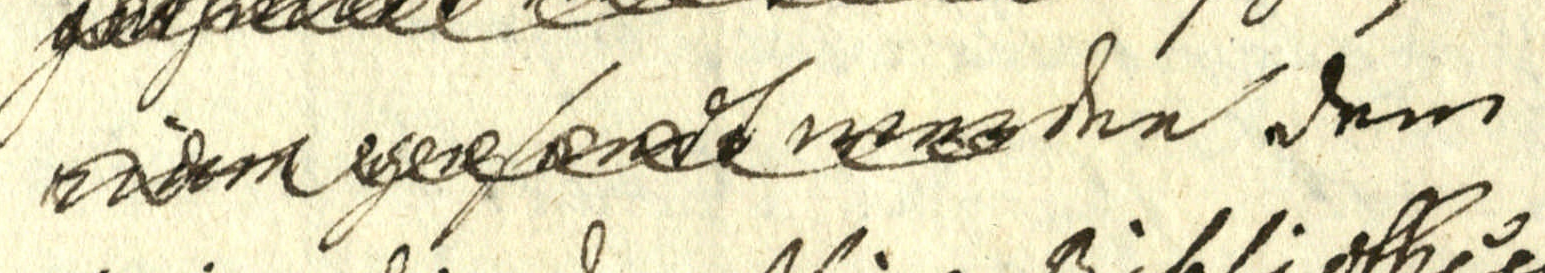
rio gesendet werden dem Herrn Vice Cancel¬
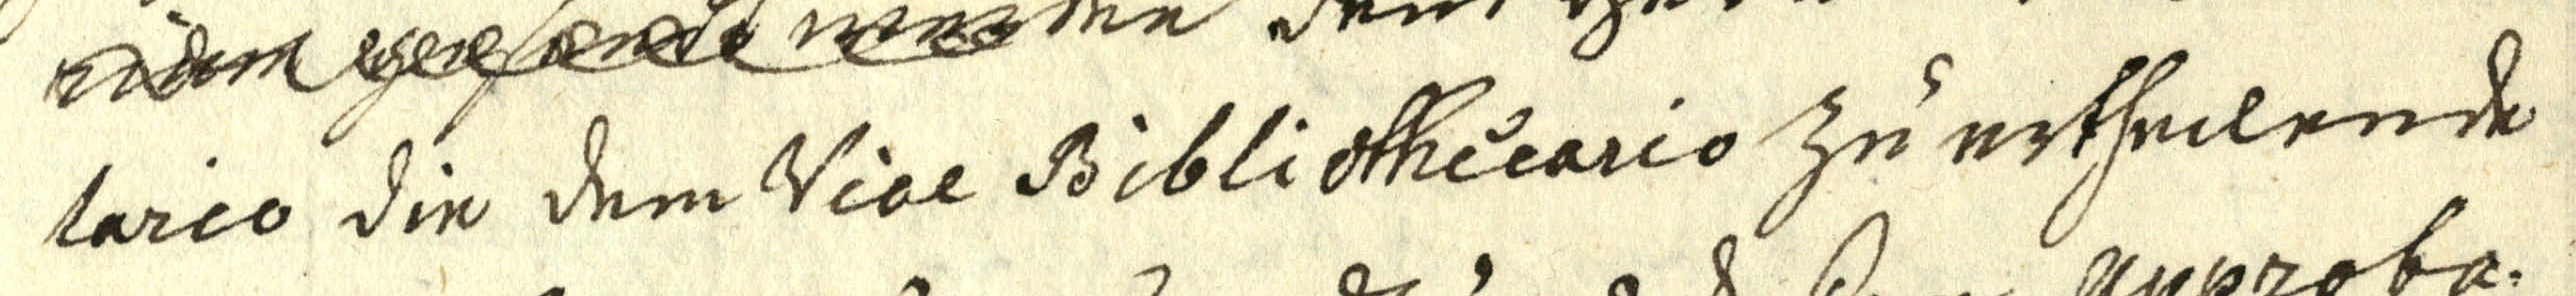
lario die dem Vice Bibliothecario zu ertheilende
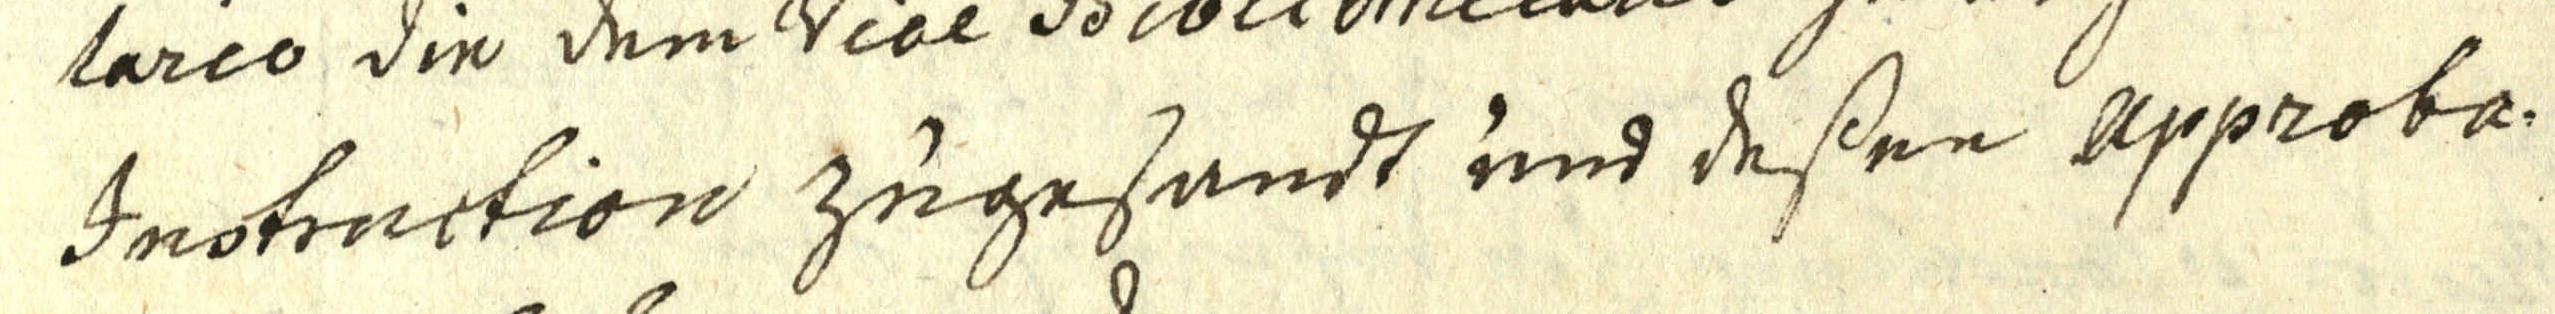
Instruction zugesandt und deßen Approba¬
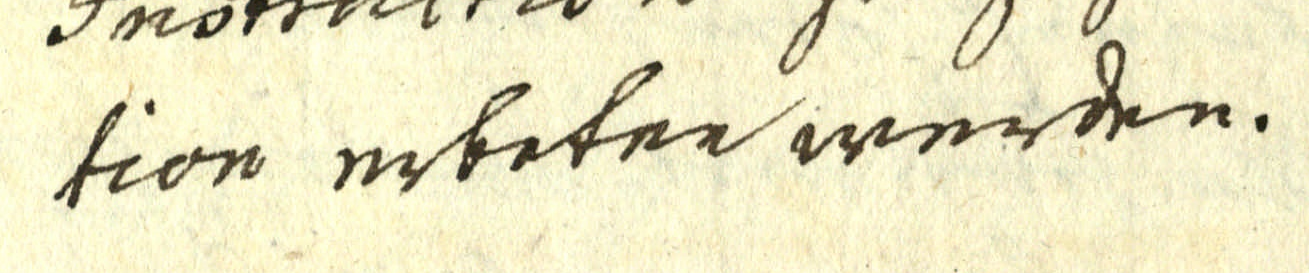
tion erbeten werden.
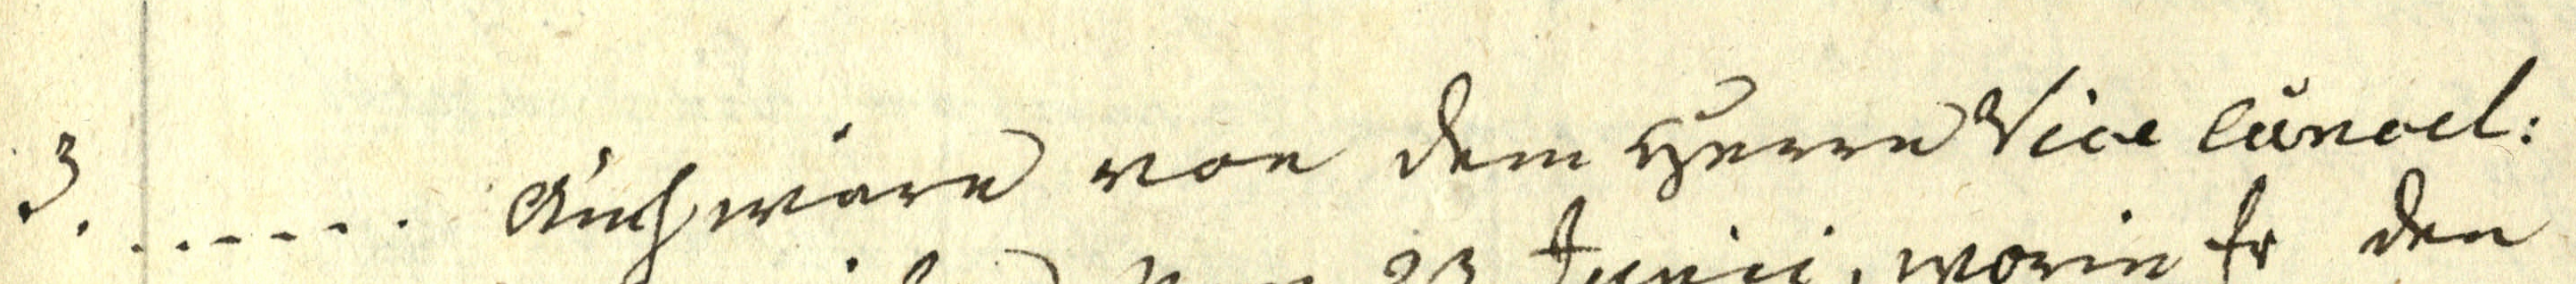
3. Auch wäre von dem Herrn Vice Cancel¬
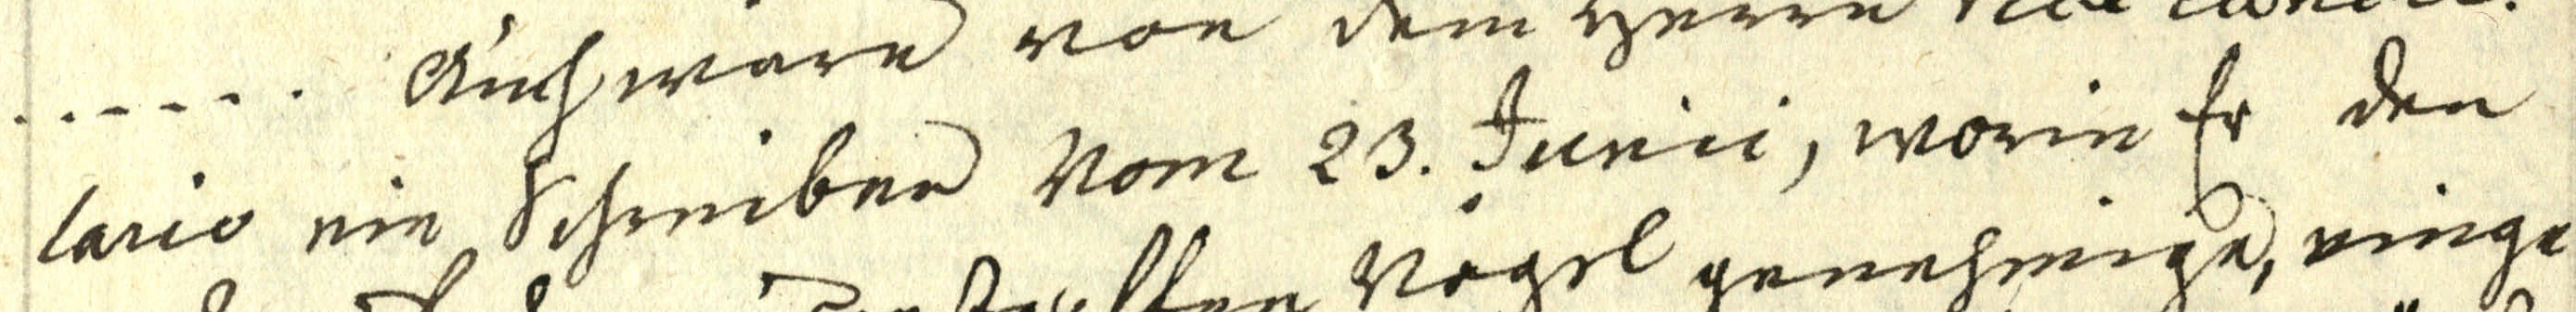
lario ein Schreiben vom 23. Junii, worin Er den
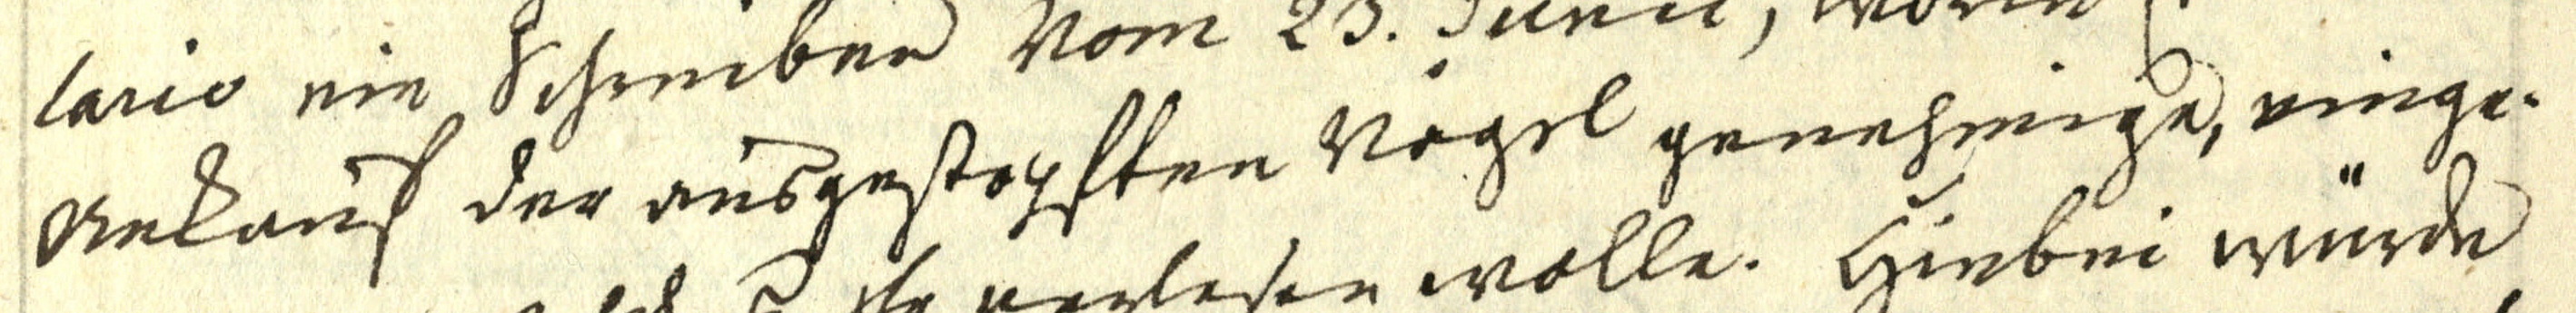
Ankauf der ausgestopften Vögel genehmige, einge¬
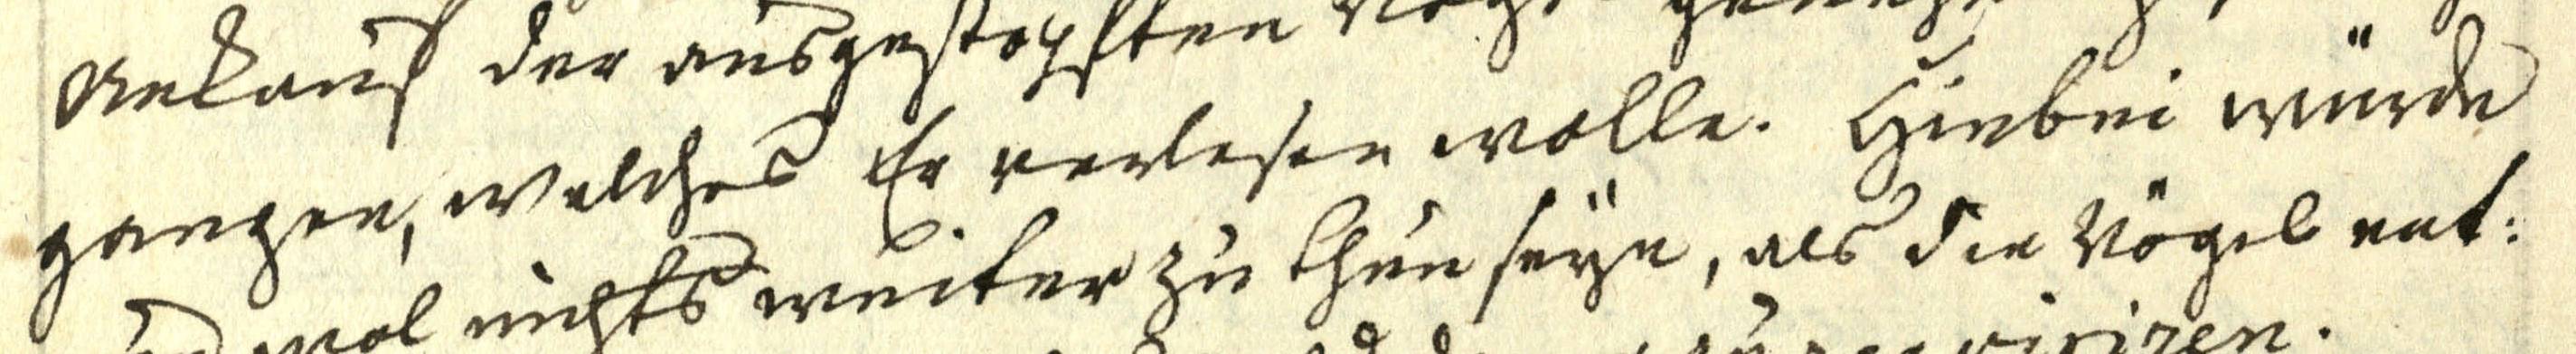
gangen, welches Er verlesen wolle. Hiebei würde
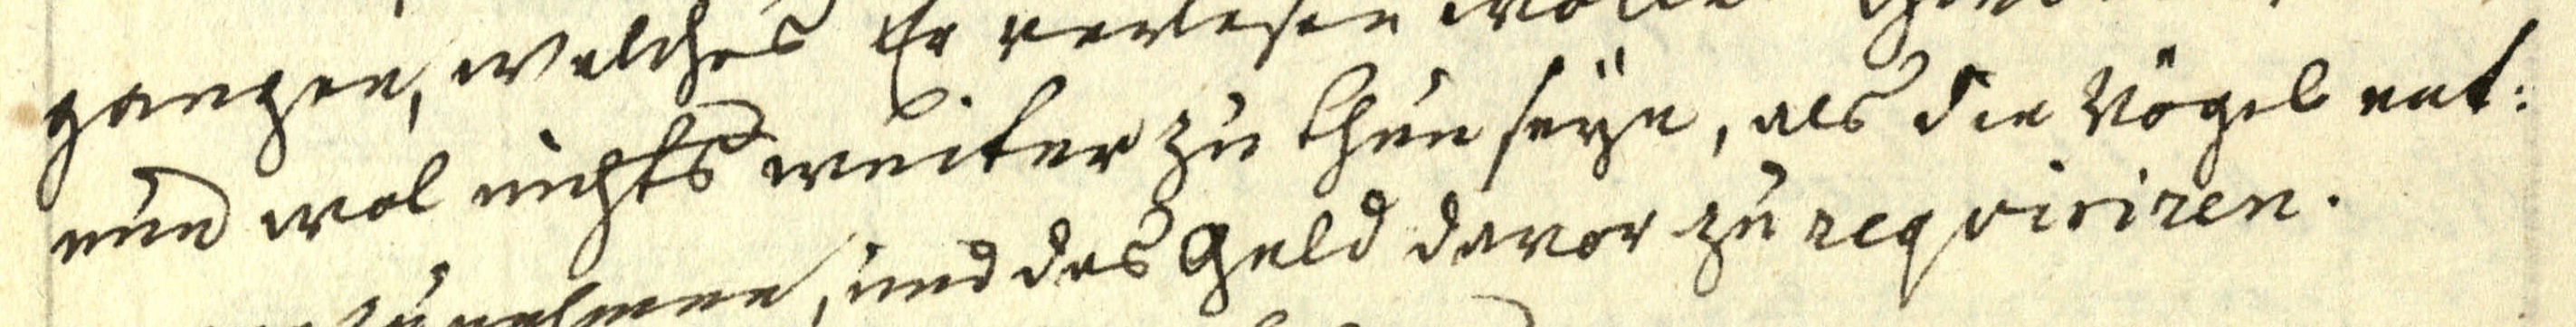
nun wol nichts weiter zu thun seÿn, als die Vögel ent¬
